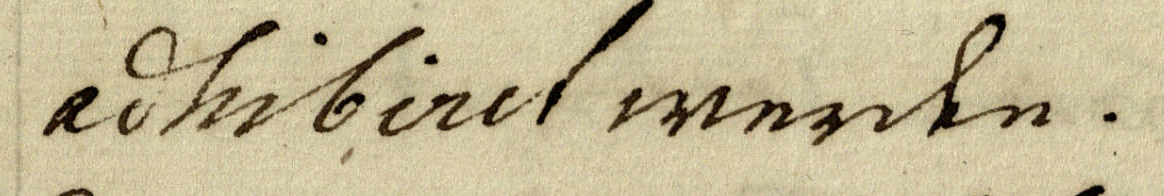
adhibiret werden.
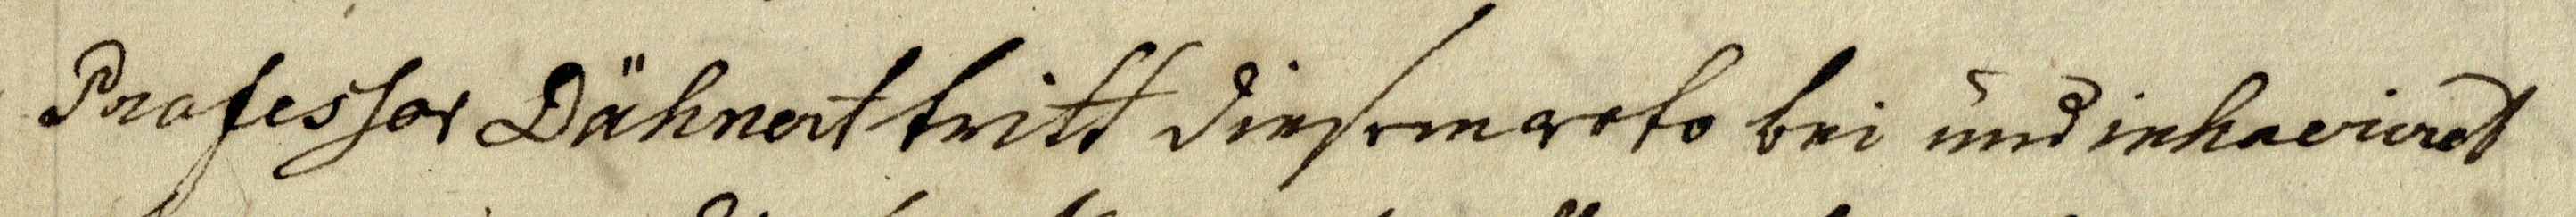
dh Professor Dähnert tritt diesem voto bei und inhaeriret
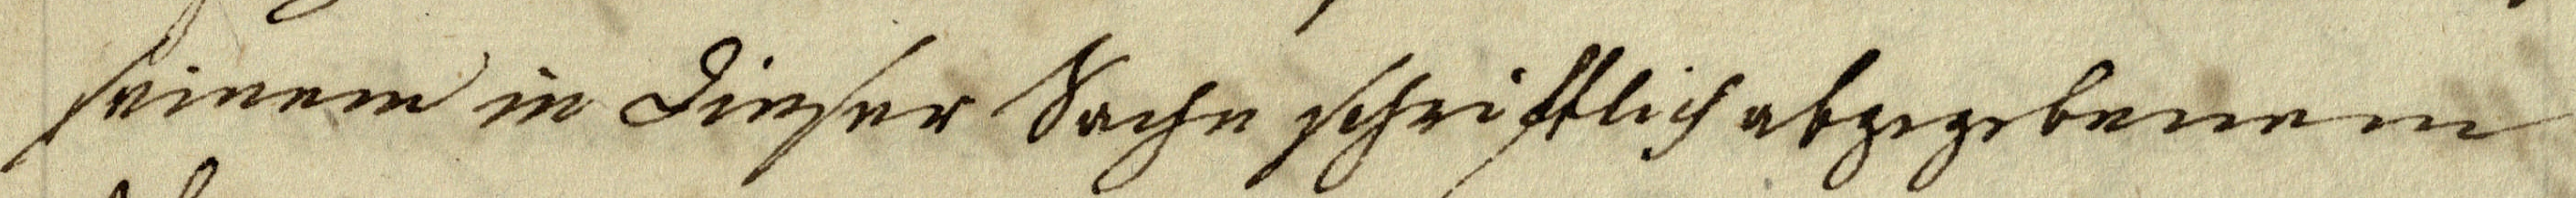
seinem in dieser Sache schriftlich abgegebenem
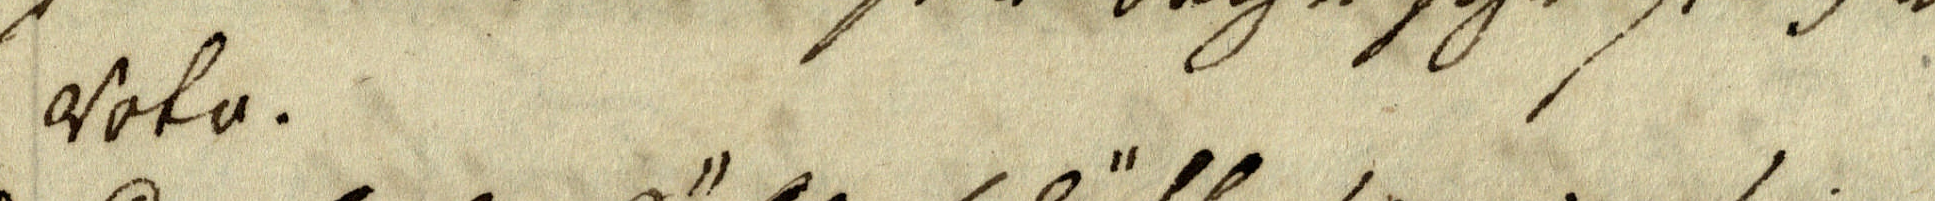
voto.
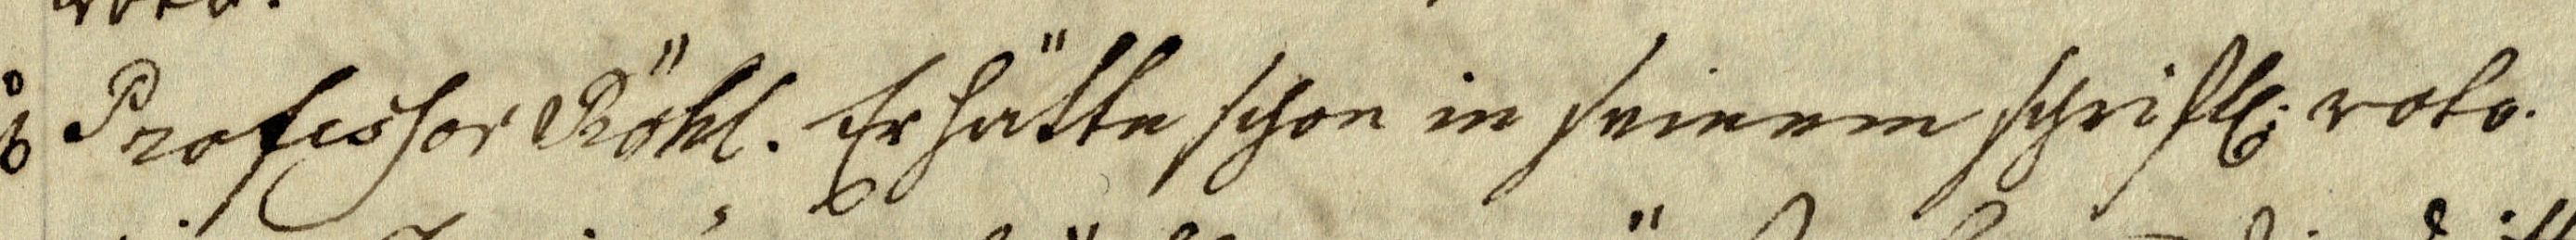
dh Professor Röhl. Er hätte schon in seinem schriftl. voto
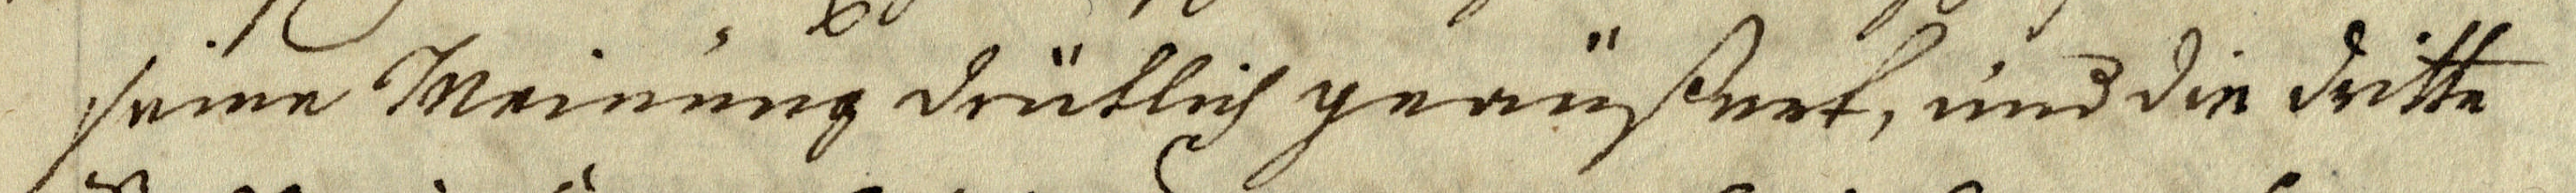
seine Meinung deutlich geäußert, und die dritte
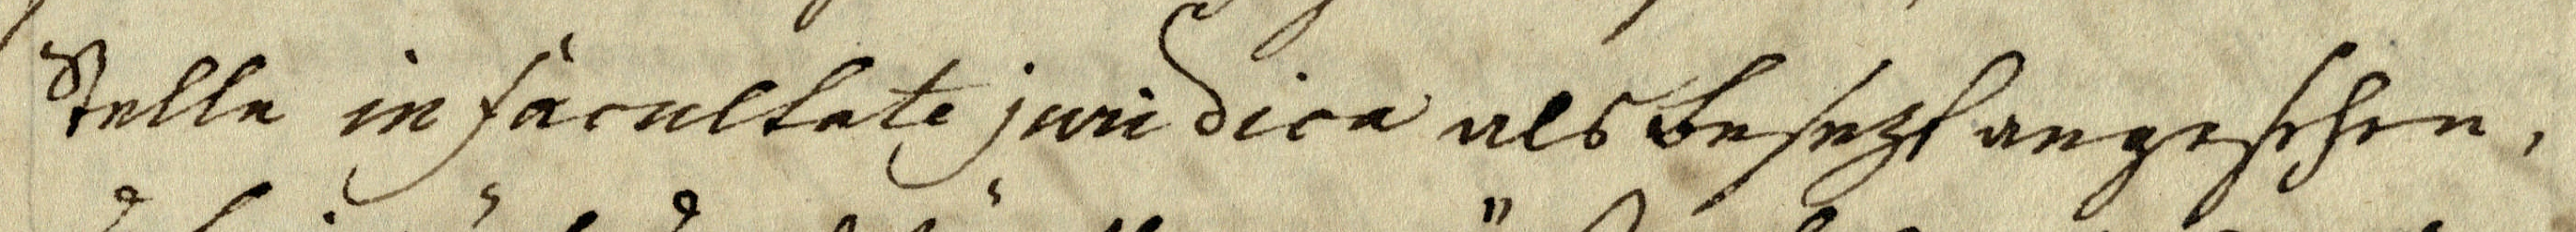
Stelle in Facultate juridica als besezt angesehen,
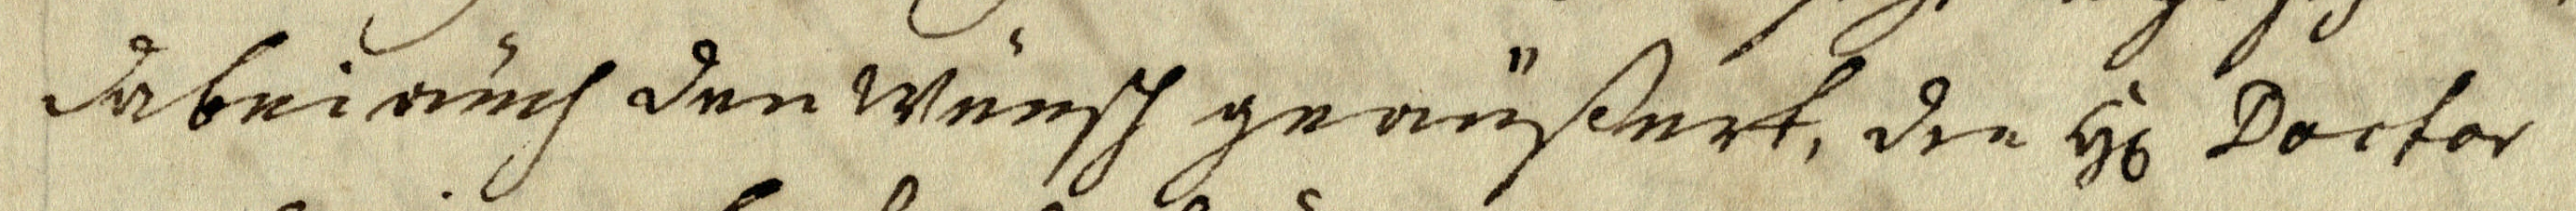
dabei auch den Wunsch geäußert, den H Doctor
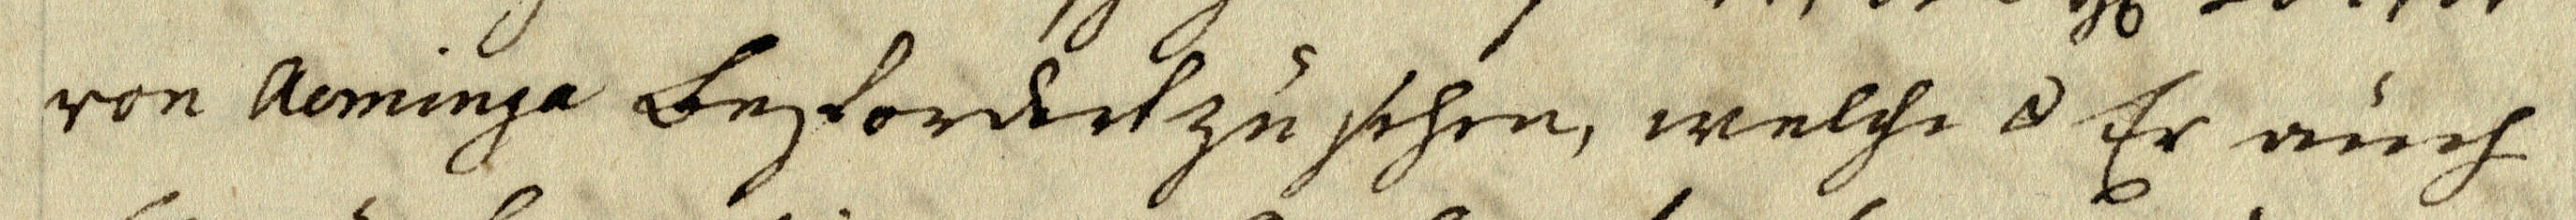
von Aeminga befordert zu sehen, welche Er auch
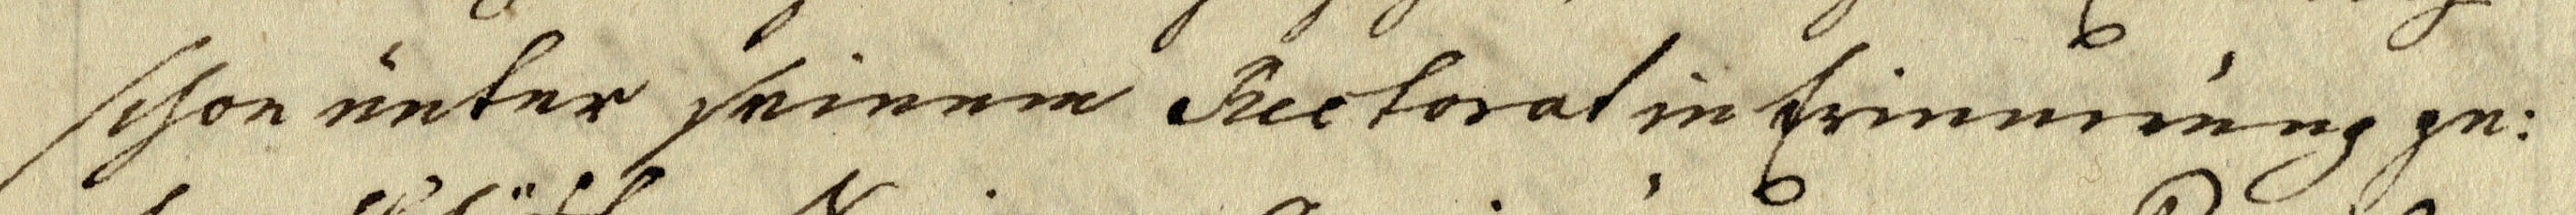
schon unter seinem Rectorat in Erinnerung ge¬
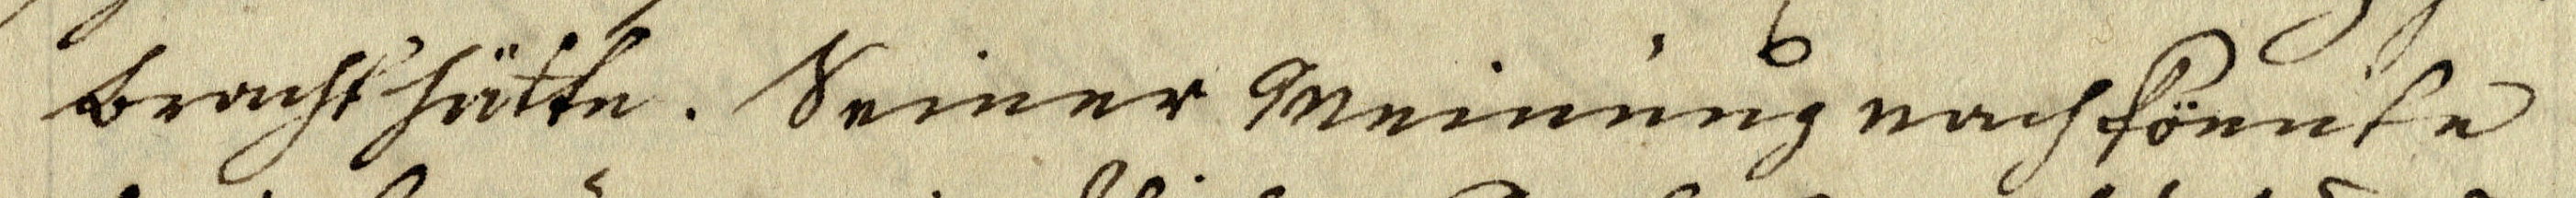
bracht hätte. Seiner Meinung nach könnte
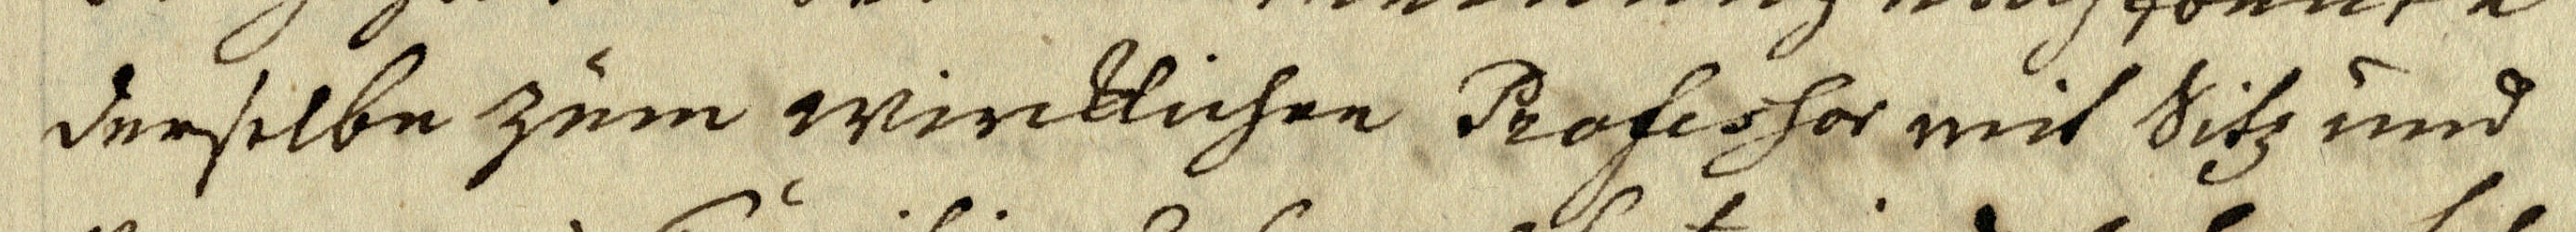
derselbe zum wircklichen Professor mit Sitz und
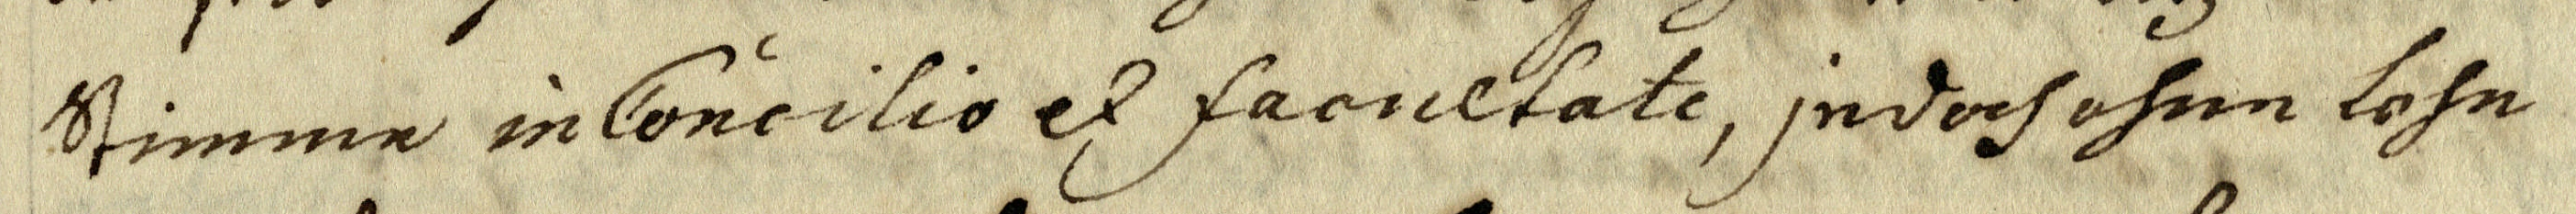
Stimme in Concilio et Facultate, jedoch ohne Lohn
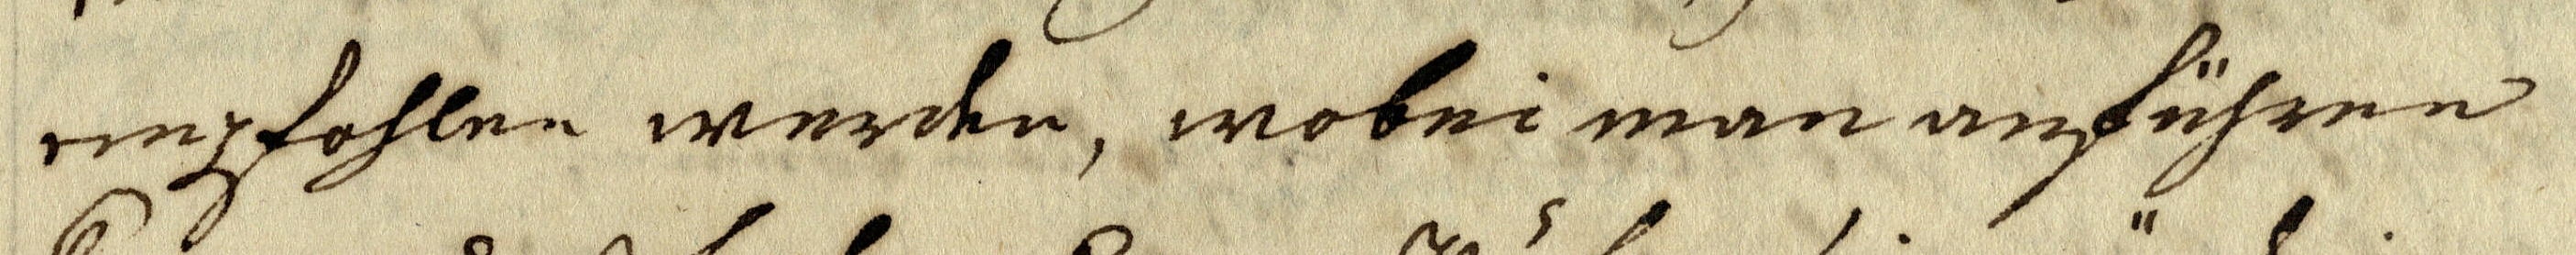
empfohlen werden, wobei man anführen
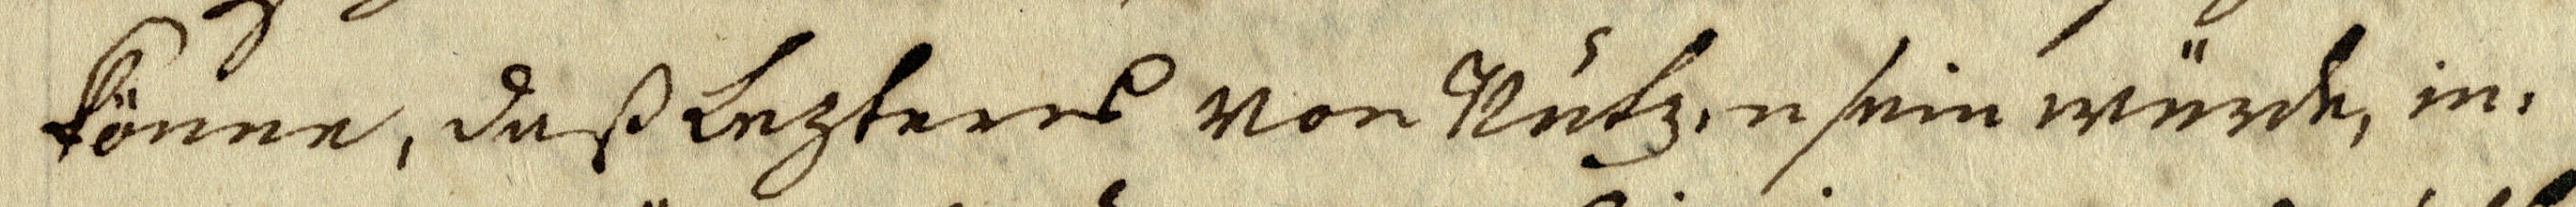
könne, daß Lezteres von Nutzen sein würde, in¬
